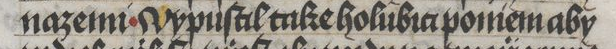nazemi.Vypuſtil take holubici poniem aby
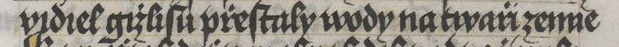vidiel giżliſu pṙeſtaly wody na twaṙí zemíe
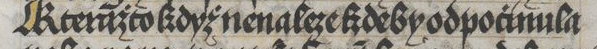Kterażto kdyż nenaleze kdeby odpoċinula
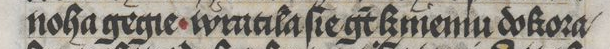noha gegíe.wratila ſie ḡt kniemu dokora¬
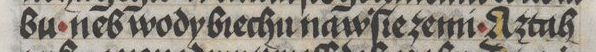bu.neb wody biechu nawẛie zemi.A ztah
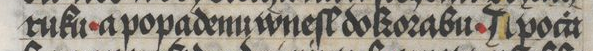ruku.a popadenu wneſl dokorabu.A poċa¬
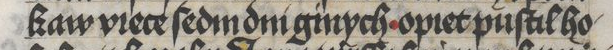kaw viece ſedm dni ginych.opiet puſtil ho¬
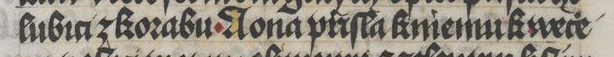lubici zkorabu.A ona pṙiſla kniemu kweċe¬
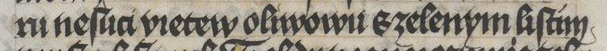ru neſuci vietew oliwowu s zelenym liſtím
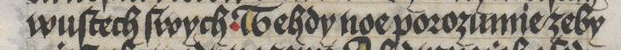wuſtech ſwych.Tehdy noe porozumie zeby
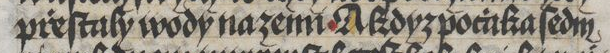pṙeſtaly wody na zemí.A kdyż poċaka ſedm
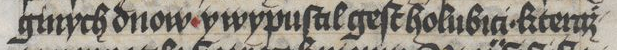ginych dnow.y wypuſtil geſt holubici.kteraż
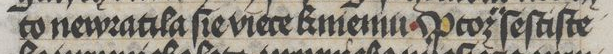to newratila ſie viece kníemu.Ꝓtoż ẛeſtiſte
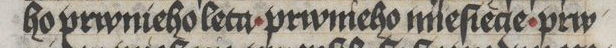ho prwníeho leta.prwnieho mieſiecie.prw¬
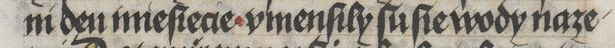ni den mieſiecie.ymenſily ſu ſie wody naze¬
